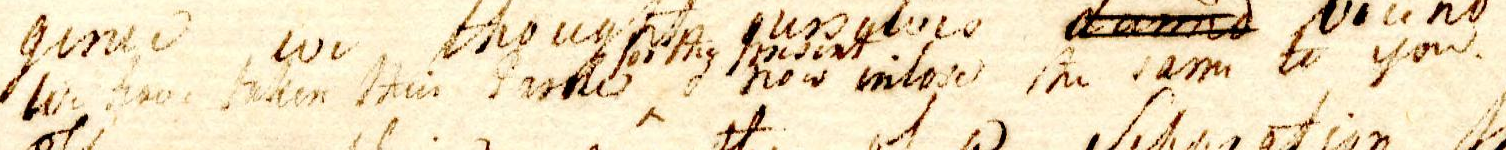We have taken their Parle ^ how inclose the same to you.
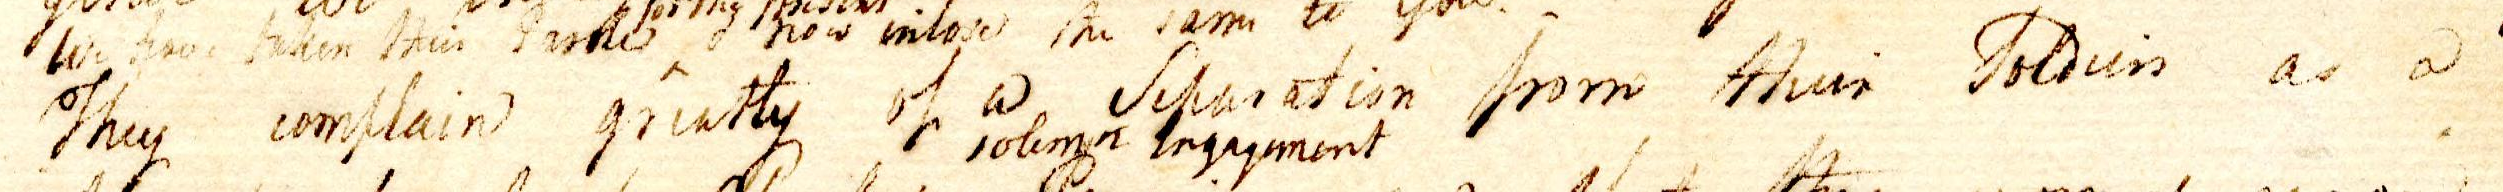They complain greatly of a Separation from their Soldiers as a
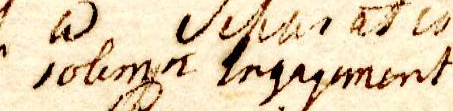solemn Engagement
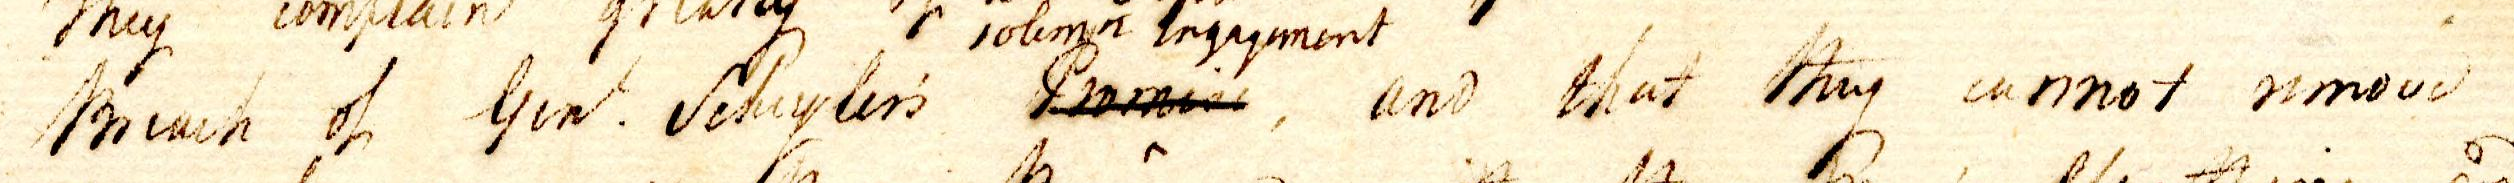Breach of Gen^l. Schuylers Promise ^, and that they cannot remove
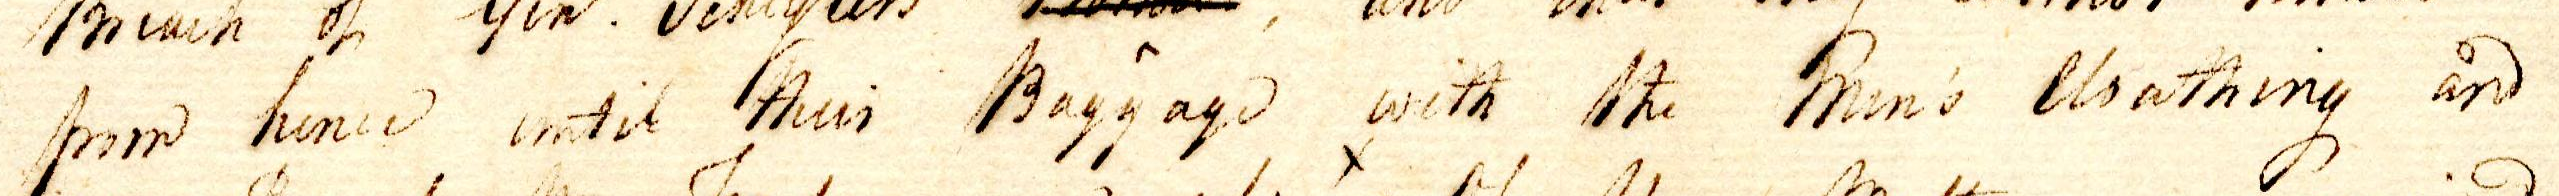from hence until their Baggage with the Men's Usathing and
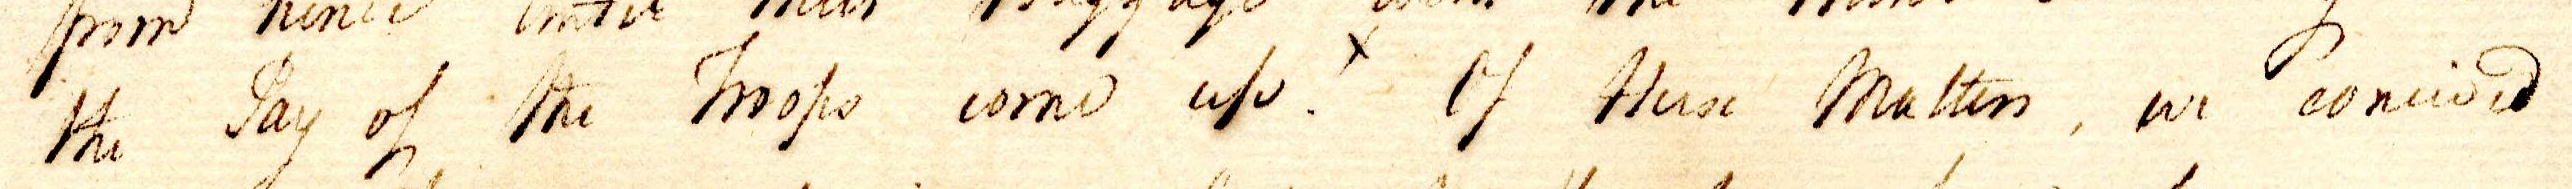the Pay of the Troops come up. Of these Matters we conceived
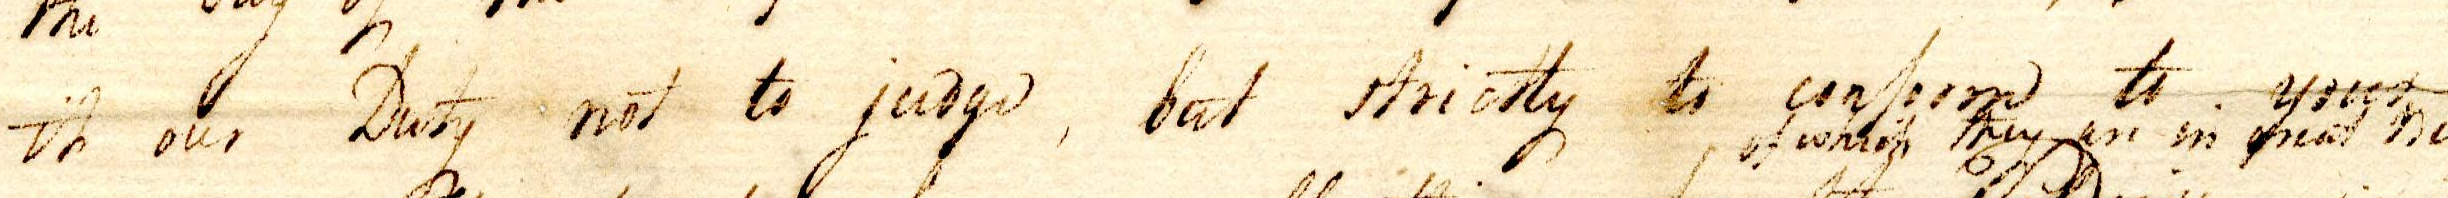it our Duty not to judge, but strictly to conform to your
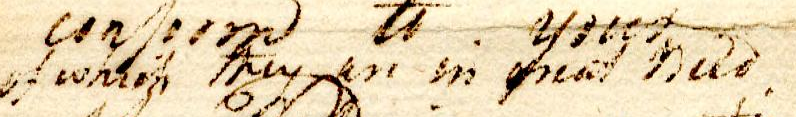of whose they are in great Need
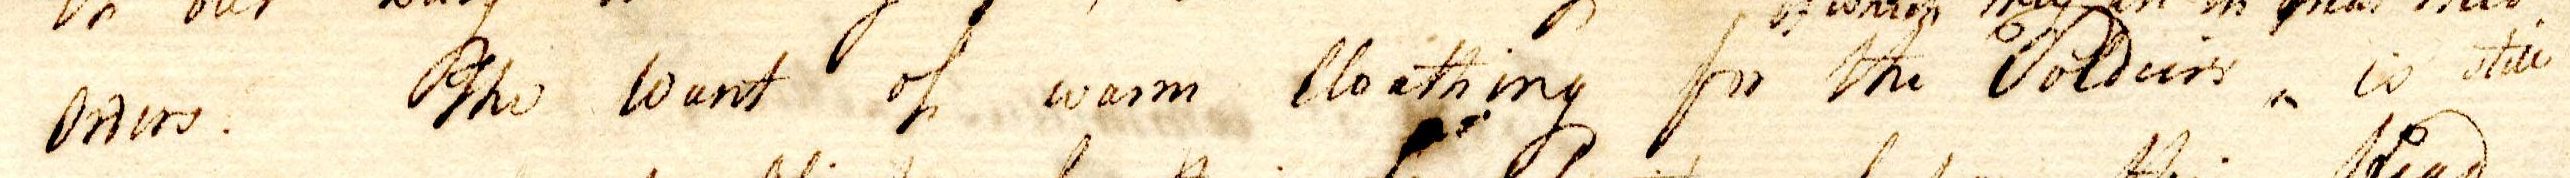Orders. The want of warm Clothing for the Soldiers ^ is still
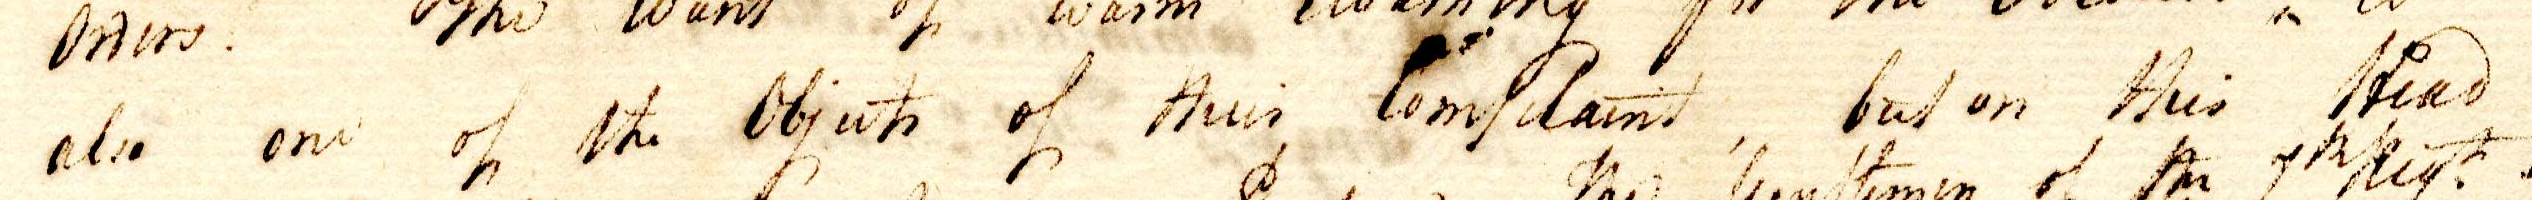also one of the Objects of their Complaint but on this Head
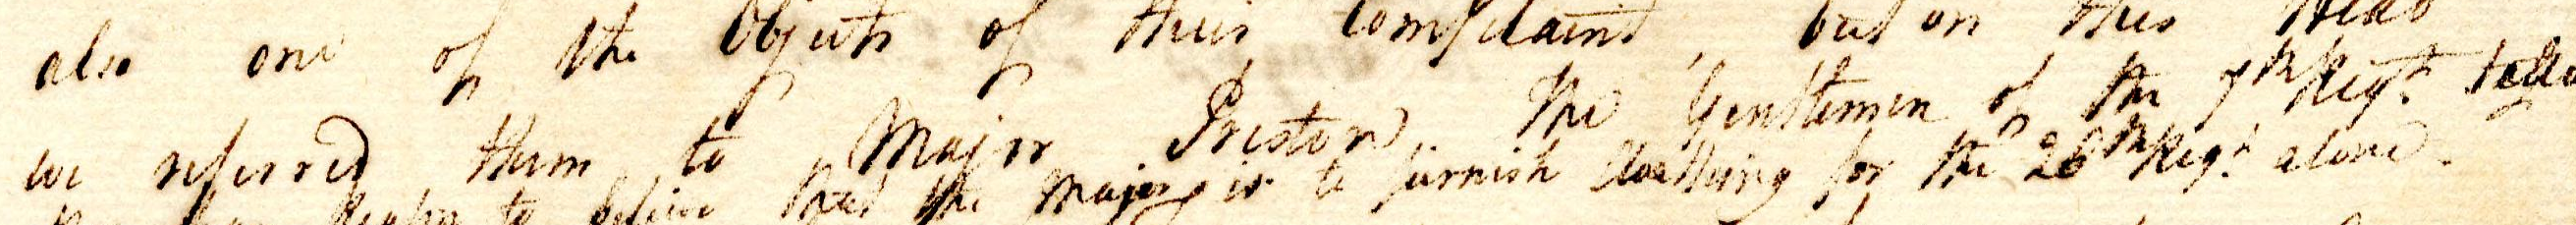we referred them to Major Preston. The Gentlemen of the 7th Reg^t. tell a
